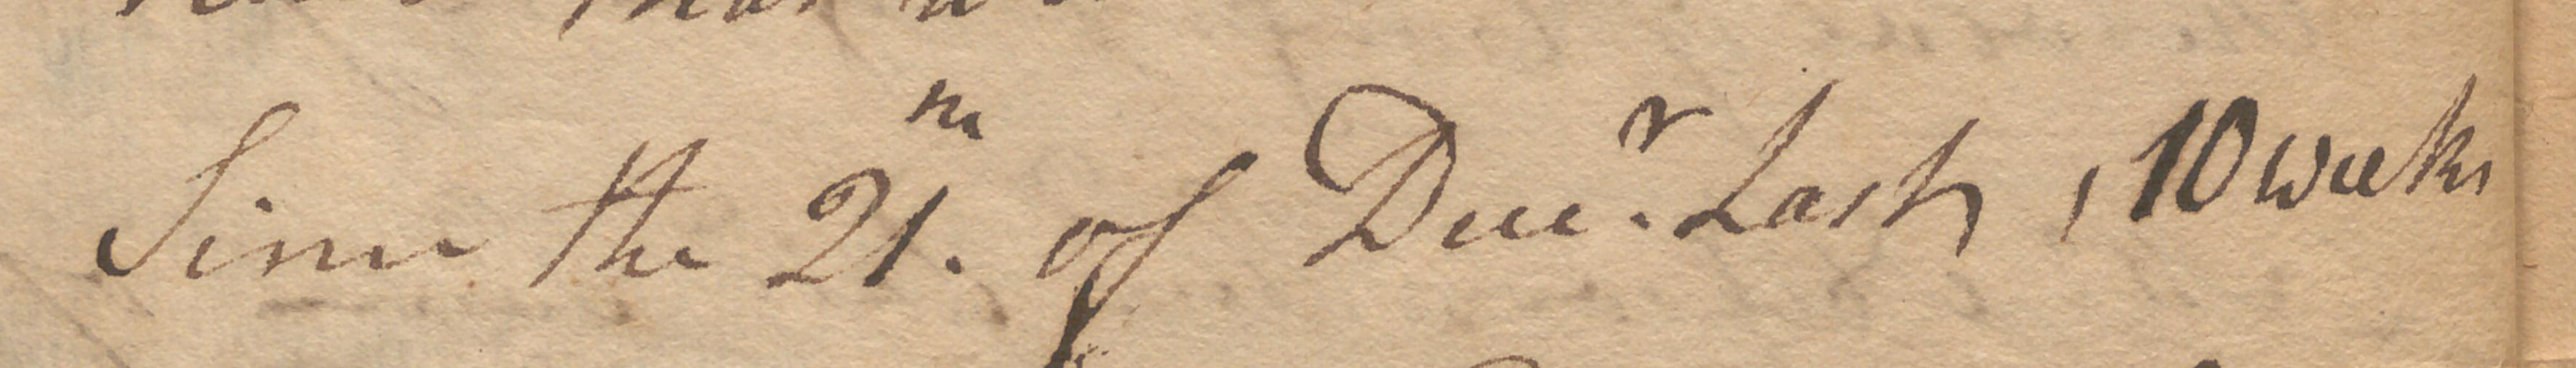Since the 21^th. of Dece^r. Last 10 weeks
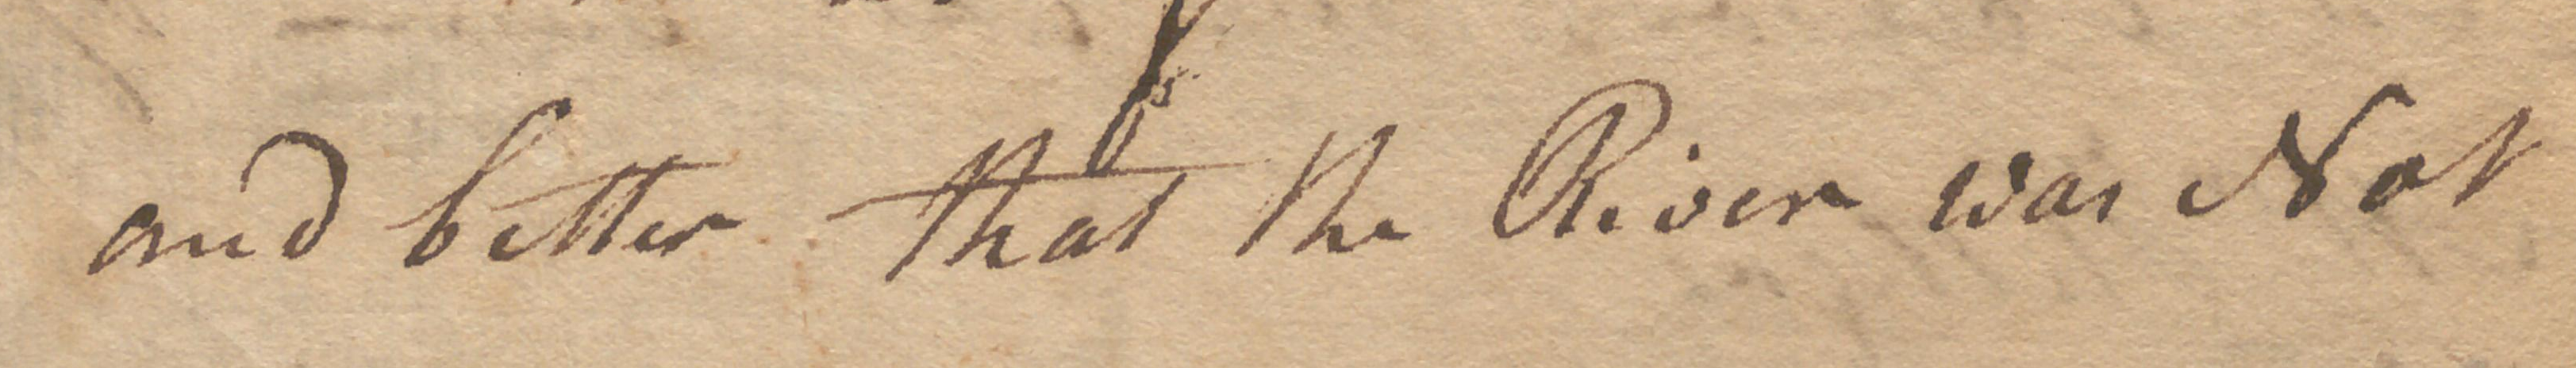and better that the River was Not
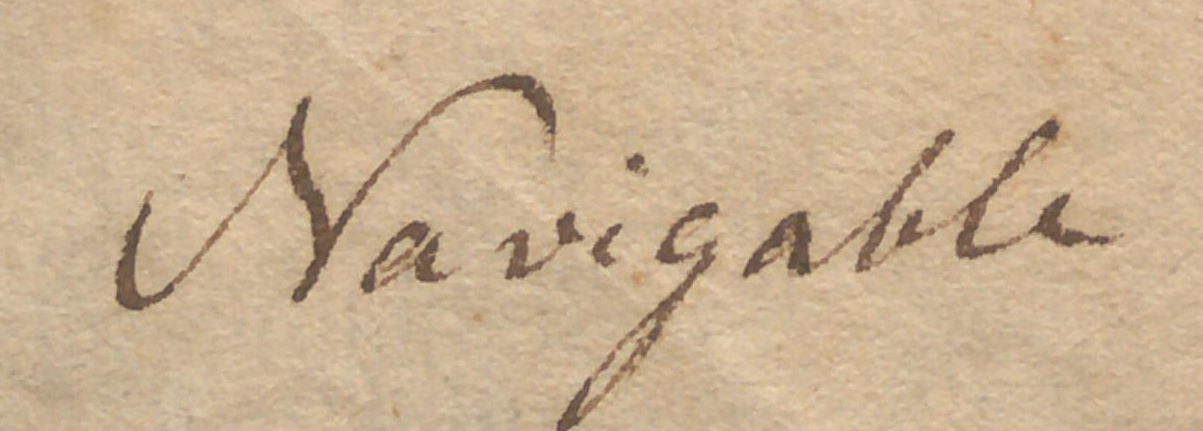Navigable
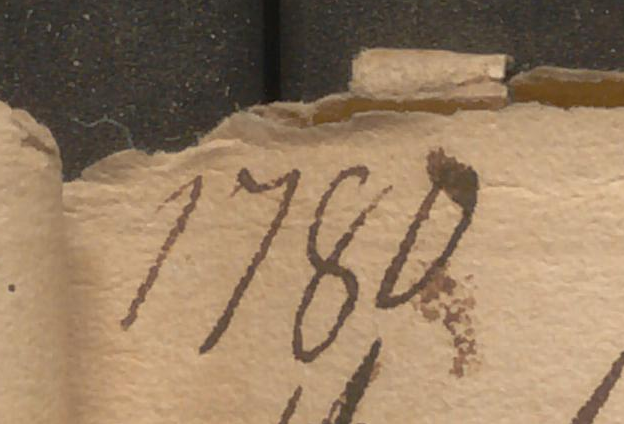1780
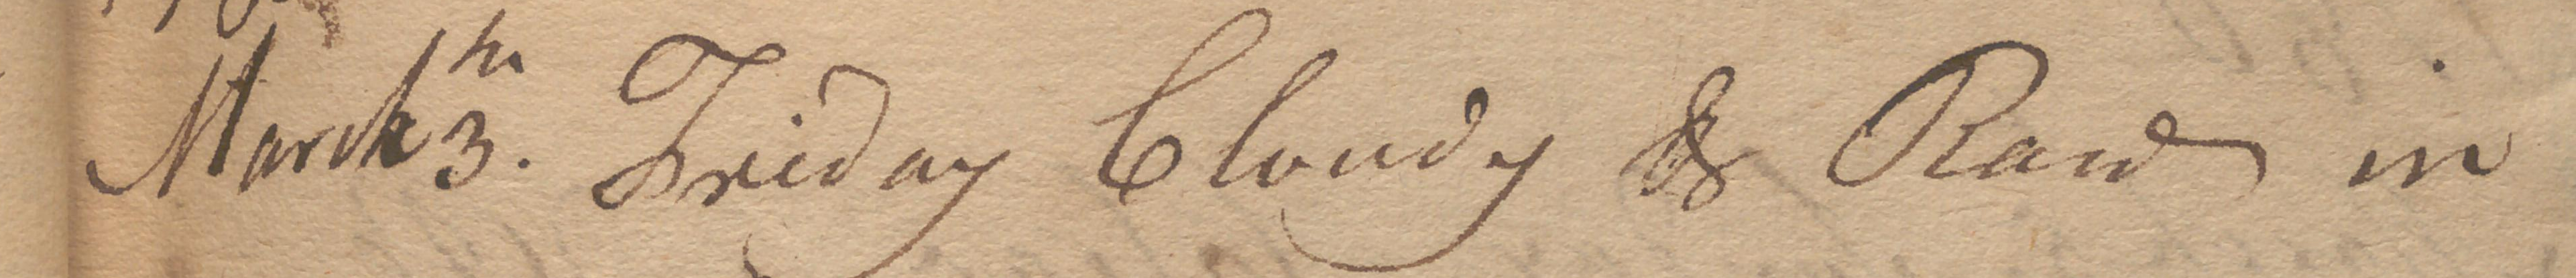March 3d. Friday Cloudy & Raw in
